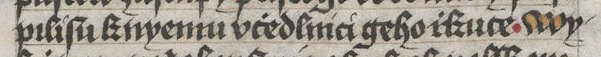pili ſu k nyemu vċedlníci geho ṙkuce.Wy¬
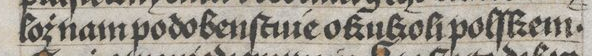loż nam podobenſtuíe okukoli polſkem
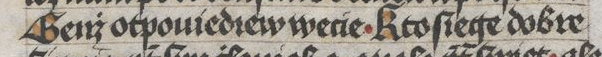Genž otpouiediew wecie.Kto ſiege dobre¬
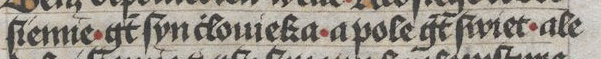ſíemie.ḡt ſyn ċlouieka.a pole ḡt ſwiet.ale
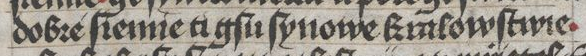dobré ſiemie ti gſu ſynowe kralowſtwíe.
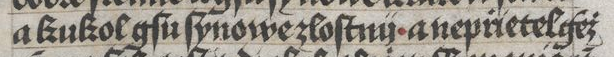a kukol gſu ſynowé zloſtnij.a nepṙíetel gēż
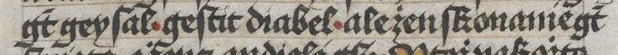ḡt gey ſal.geſtit diabel.ale żen ſkonaníe ḡt
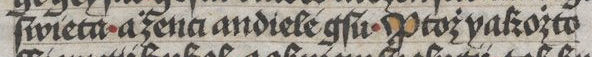ſwieta.a żenci andielé gſú.Ꝓtoż yakożto
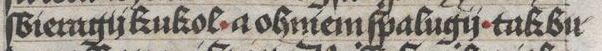ſbieragij kukol.a ohniem ſpalugij.tak bu¬
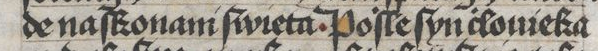de naſkonaní ſwíeta.Poẛle ſyn ċlouieka
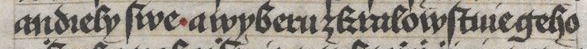andiely ſwe.a wyberu zkralowſtuíe geho
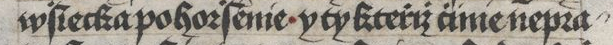wẛiecka pohorẛeníe.y ty kteṙiż ċinie nepra¬
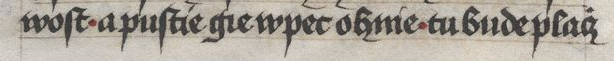woſt.a puſtie gie wpec ohnie.tu bude placż
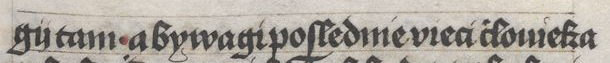gij tam.a bywagi poſlednie vieci ċlouieka
